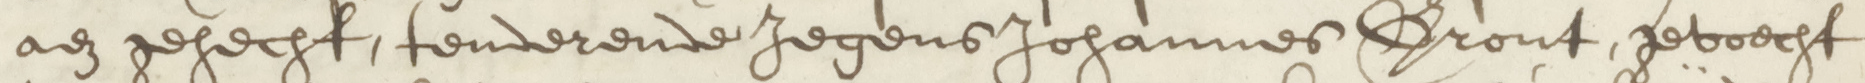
aen gehecht, tenderende Jegens Johannes Gront, gevoecht
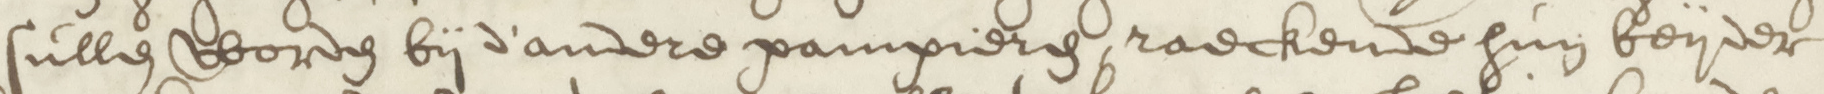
sullen worden bij d'andere pampieren, raeckende hun beijder
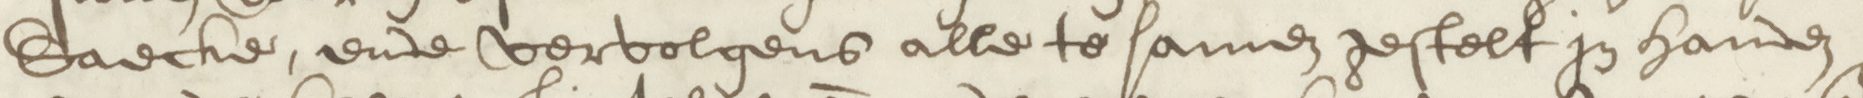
Saecke, ende vervolgens alle te samen gestelt in handen
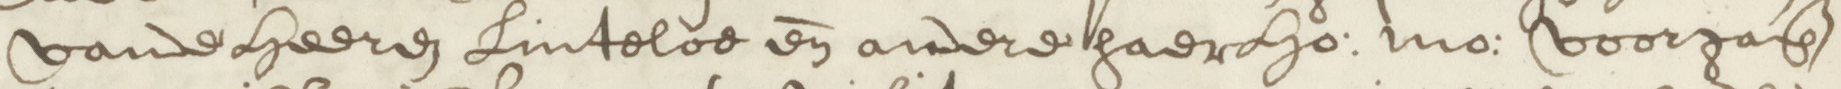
vande Heeren Linteloe en andere haer Ho:Mo: voorgae
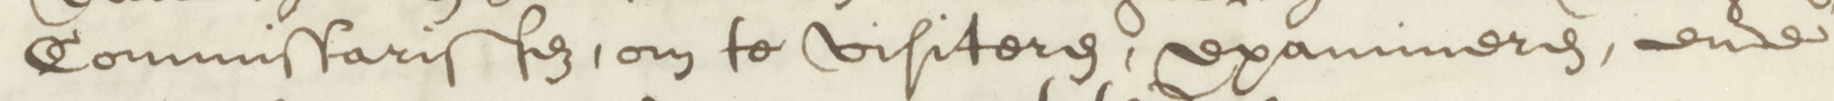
Commissarissen, om te visiteren, examineren, ende
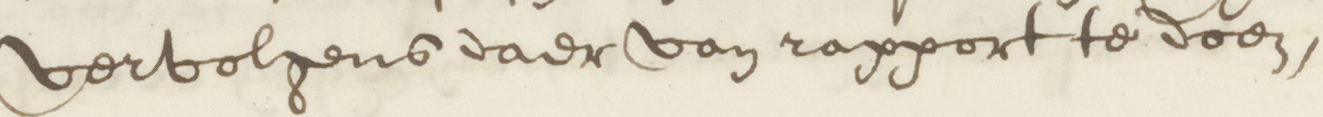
vervolgens daer van rapport te doen.
